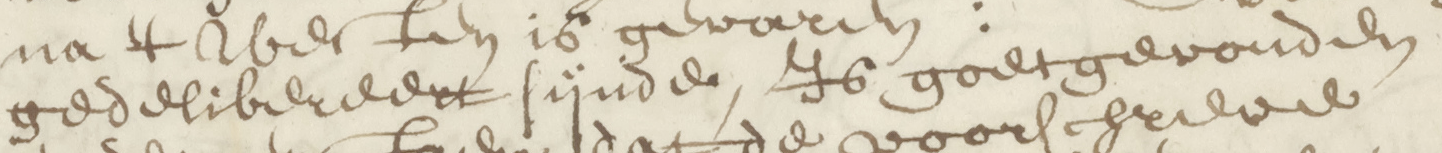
gedelibereert sijnde, Is goetgevonden
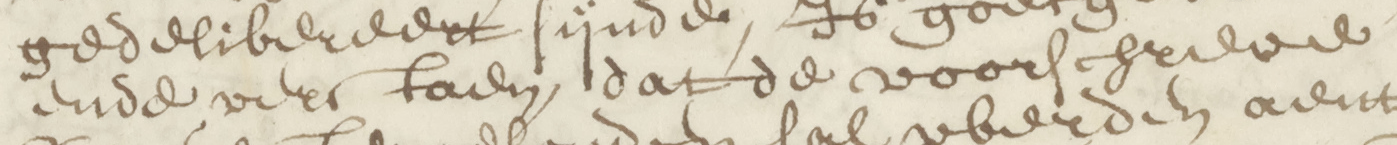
ende verstaen, dat de voorschreve
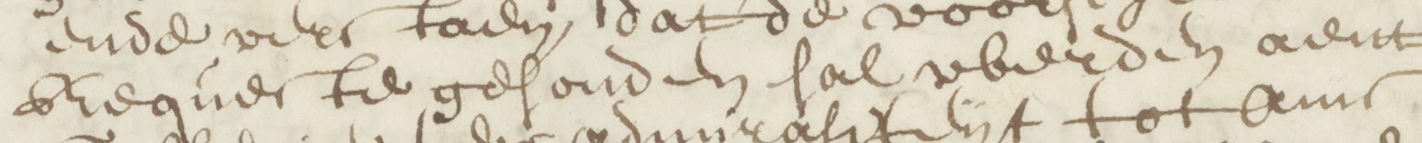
Requeste gesonden sal werden aent
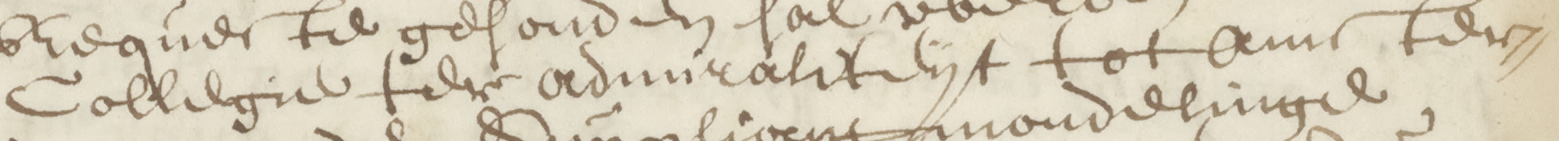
Collegie ter Admiraliteijt tot Amster,,
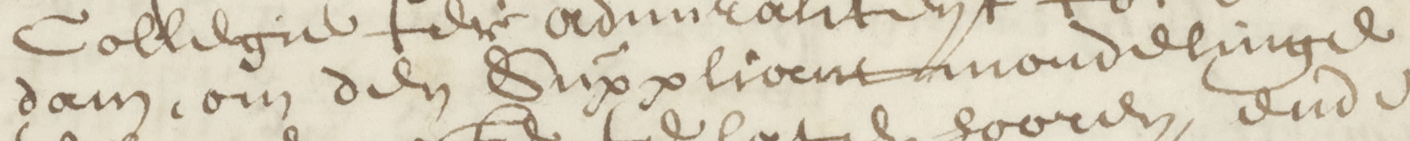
dam, om den Suppliant mondelinge
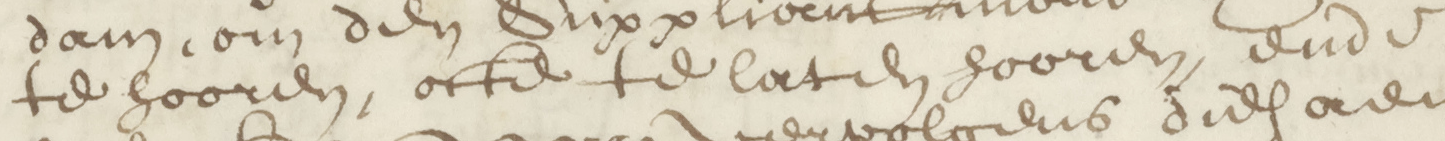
te hooren, offe te laten hooren, ende
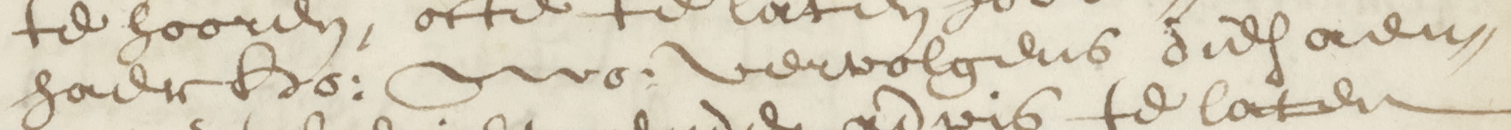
haer Ho:Mo: vervolgens diesaen,,
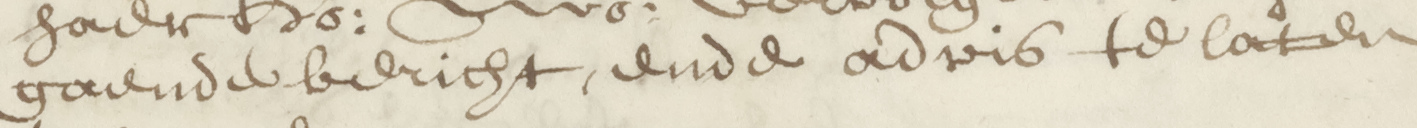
gaende bericht, ende advis te laten
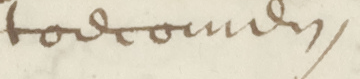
toecomen.
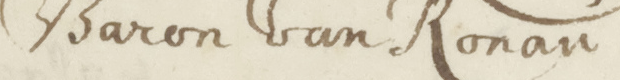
Baron van Ronau
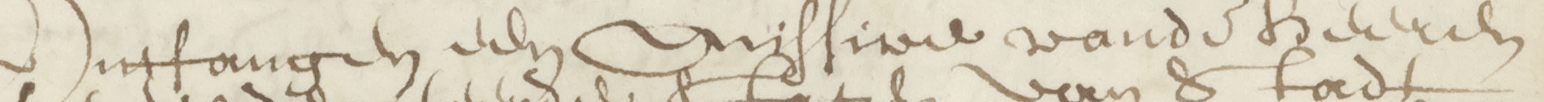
Ontfangen een missive vande heeren
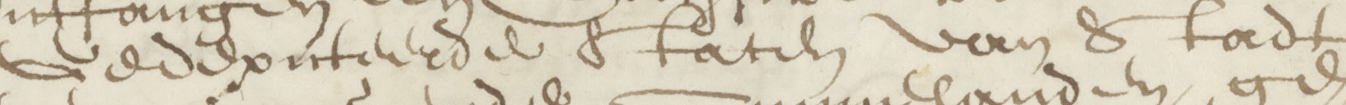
Gedeputeerde Staten van Stadt
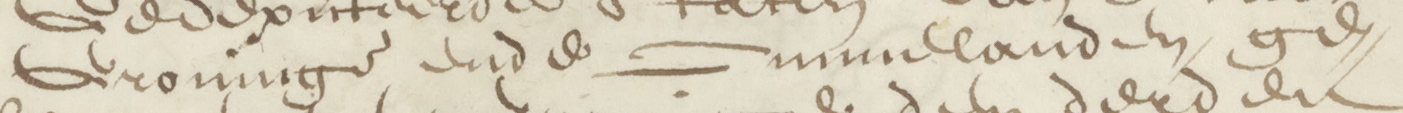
Groninge ende Ommelanden, ge,,
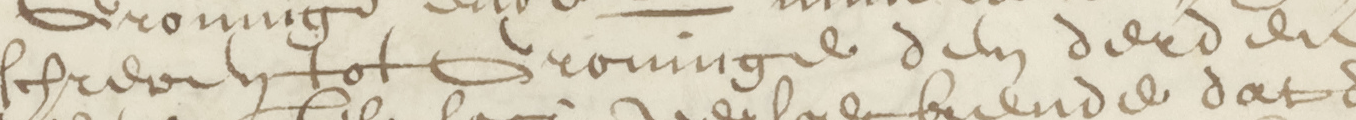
schreven tot Groninge den derden
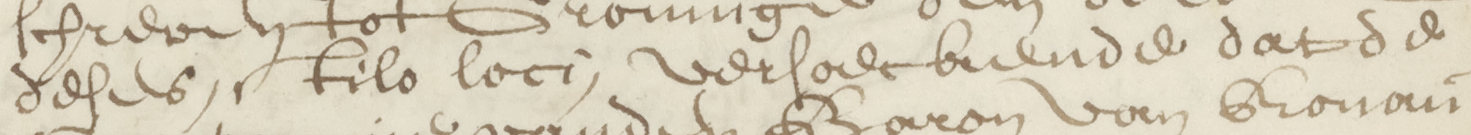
deses, stilo loci, versoeckende dat de
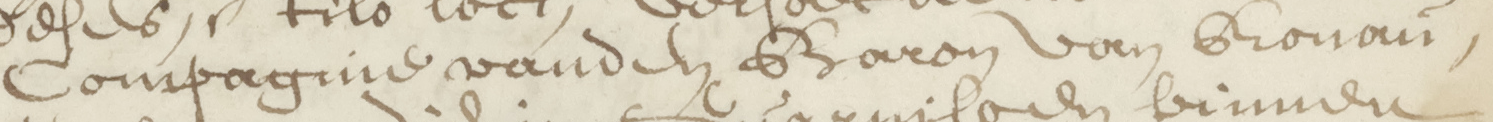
Compagnie vanden Baron van Ronau,
